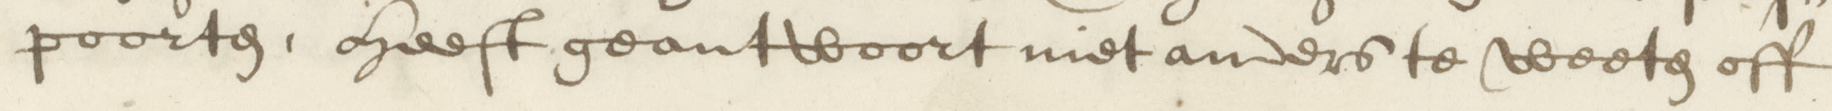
poorten, heeft geantwoort niet anders te weeten off
